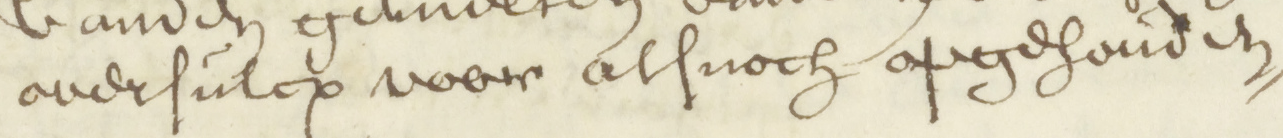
oversulcx voor alsnoch opgehouden.
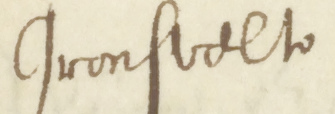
Gronsvelt
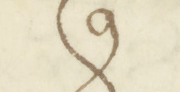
ca
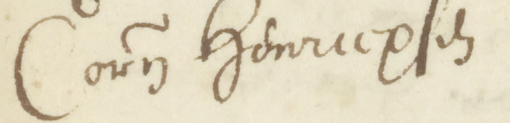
Corn Henricxsen
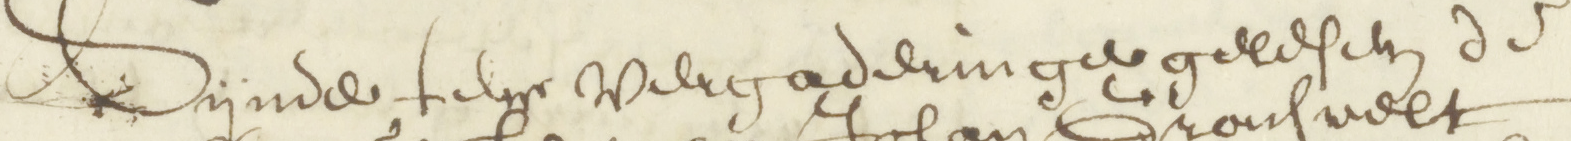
Sijnde ter vergaderinge gelesen de
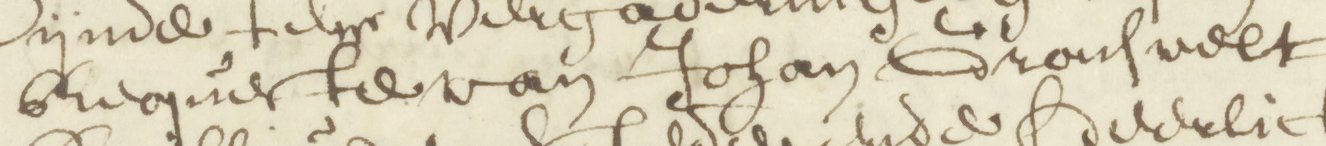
Requeste van Johan Gronsvelt
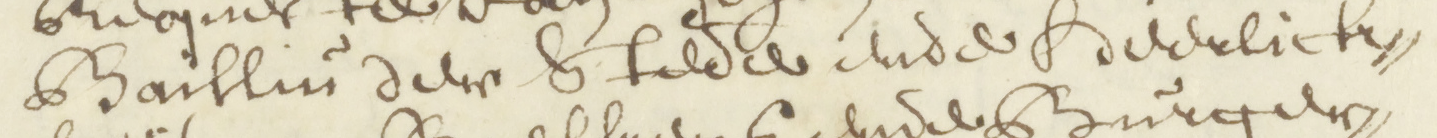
Bailliu der Stede ende Heerlick,
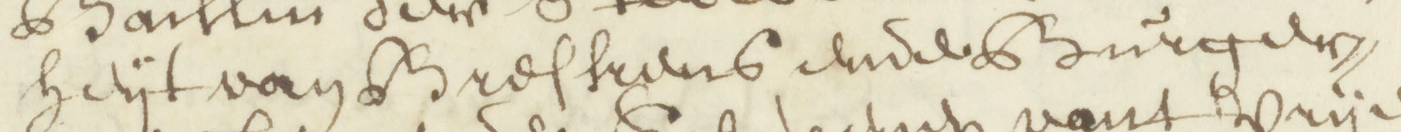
heijt van Breskens ende Burger,,
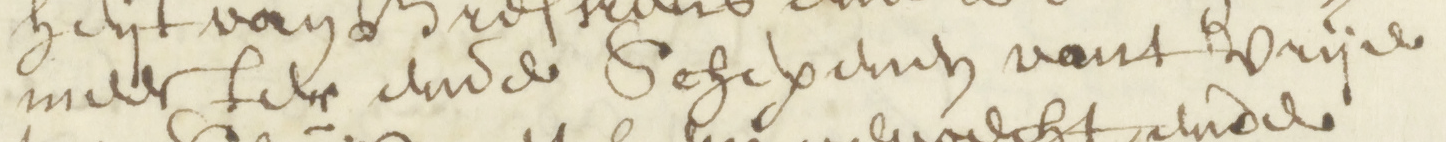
meester ende Schepenen vant Vrije
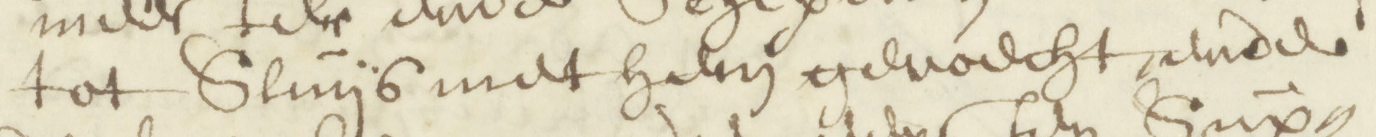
tot Sluijs met hem gevoecht, ende
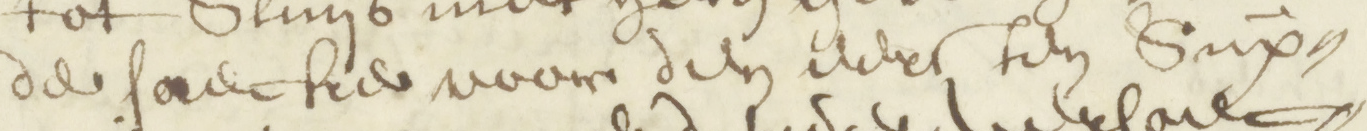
de saecke voor den eersten Sup„
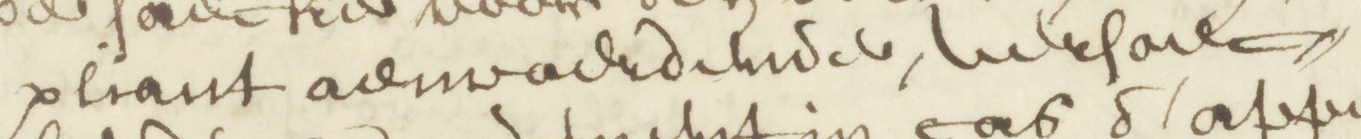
pliant aenvaerdende, versoec„
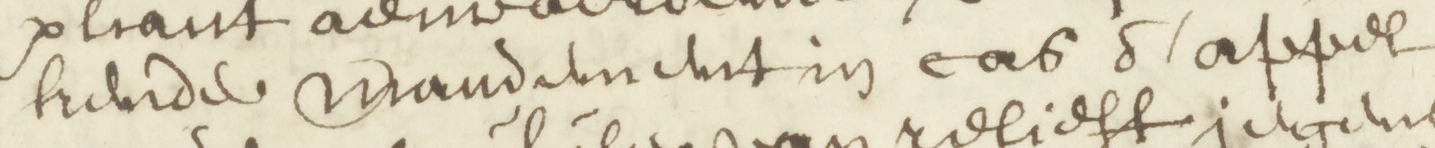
kende mandement in cas d'appel
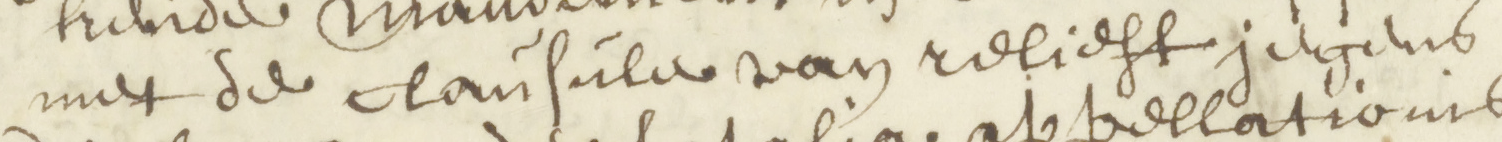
met de clausule van relieff jegens
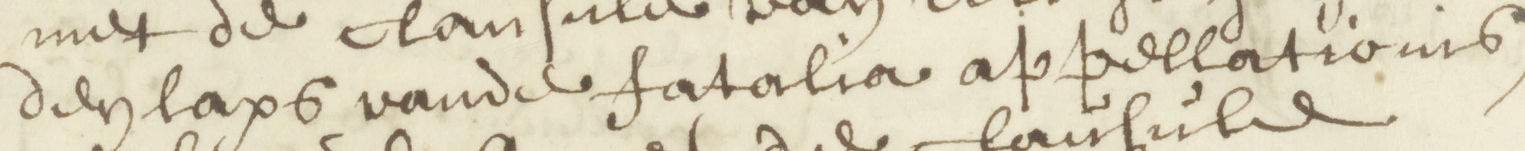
den laps vande fatalia appellationis,
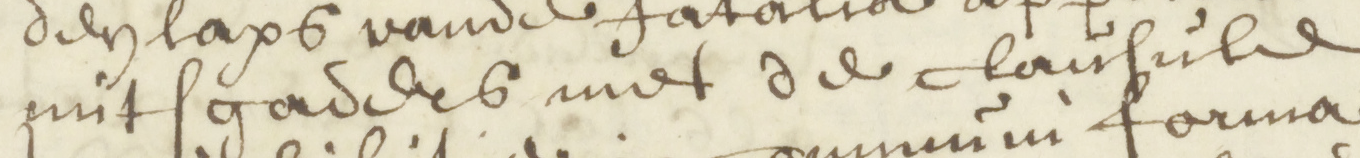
mitsgaders met de clausule
